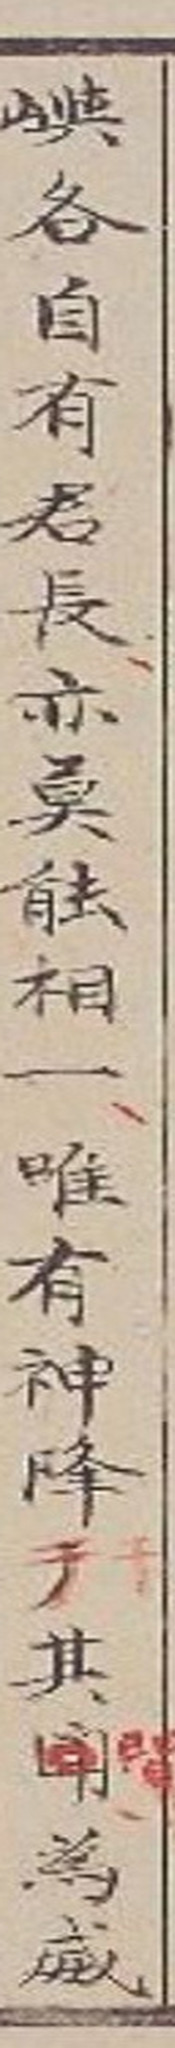嶼各自有君長、亦莫能相一、唯有神降于其聞間、為威
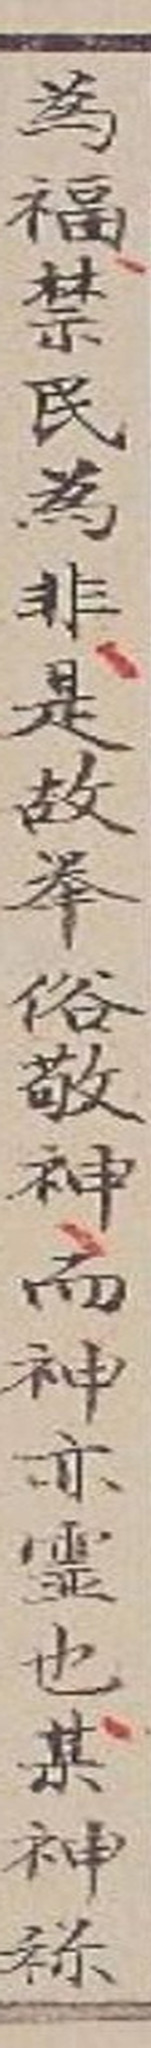為福、禁民為非、是故挙俗敬神、而神亦霊也、某神称
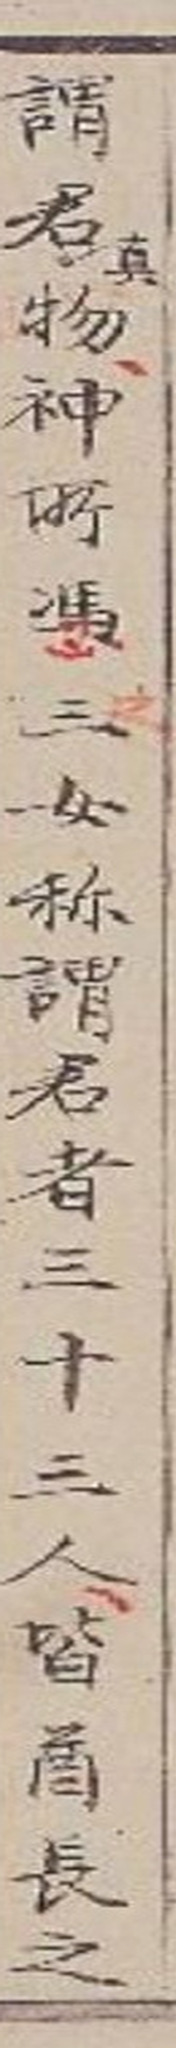謂君真物、神所憑三之女称謂君者三十三人、皆酋長之
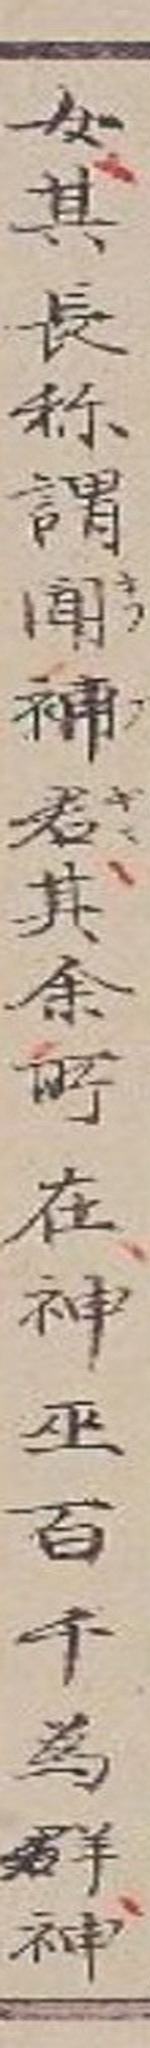女、其長称謂聞補君、其余所在、神巫百千為群、神
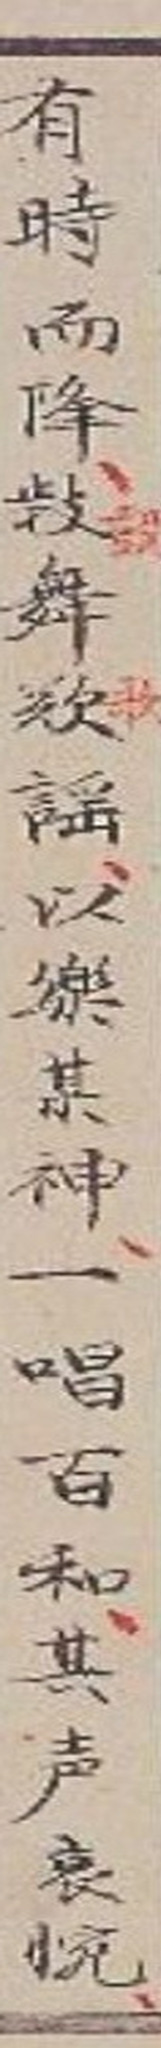有時而降、鼓舞歌謡、以楽某神、一唱百和、其声哀惋、
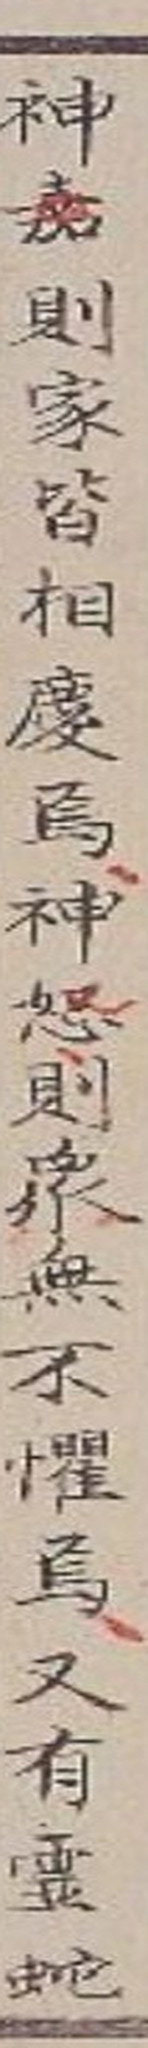神嘉喜則家皆相慶焉、神怒、則衆無不懼焉、又有霊蛇

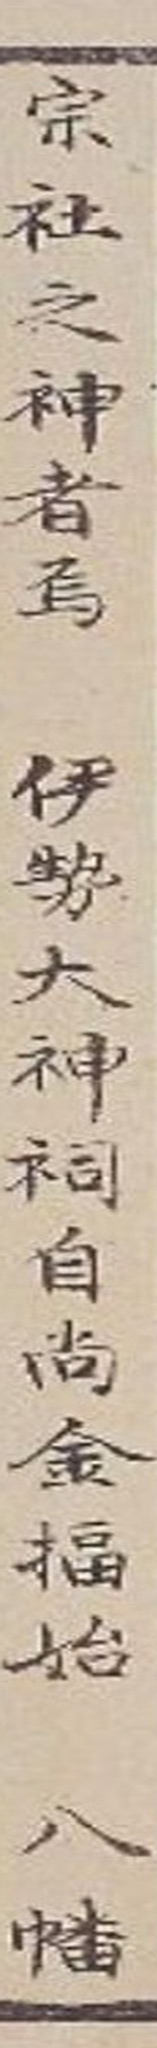宗社之神者焉伊勢大神祠自尚金福始八幡
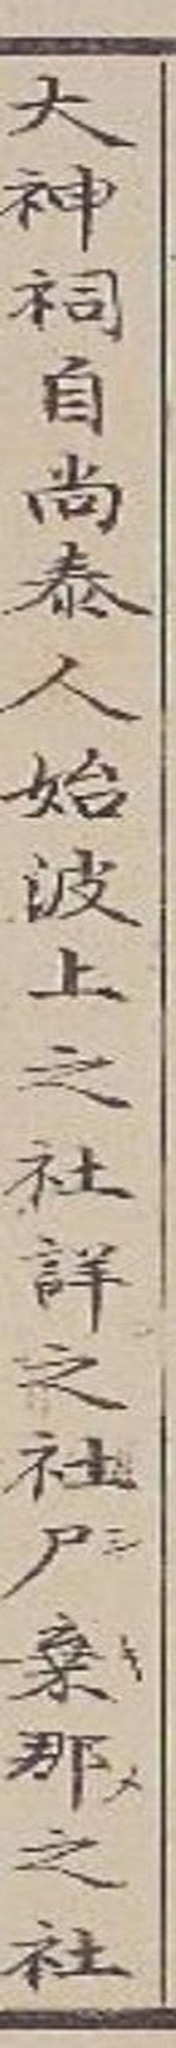大神祠自尚泰人始波上之社詳之社尸棄那之社
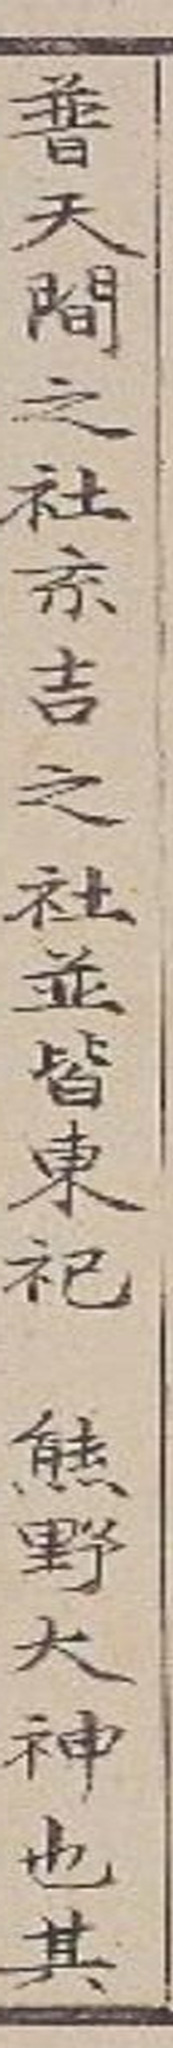普天間之社京吉之社並皆奉祀熊野大神也其
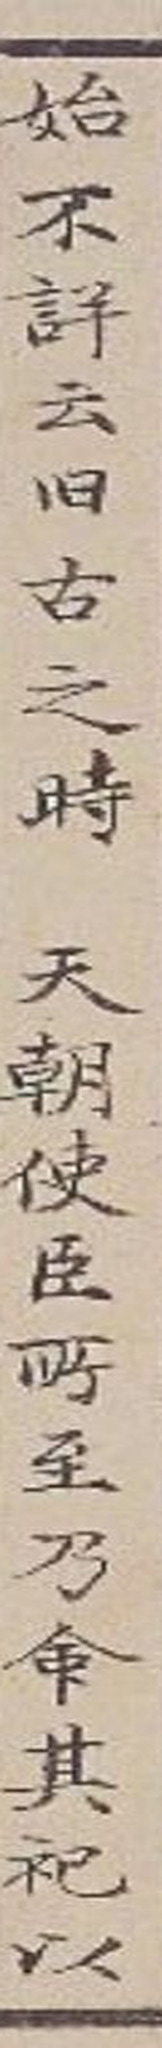始不詳云旧古之時天朝使臣所至乃命其祀以
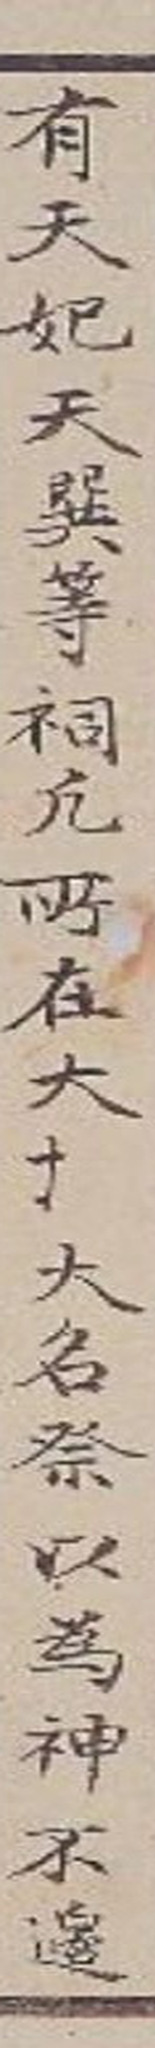有天妃巽等祠凡所在大大名祭以為神不遑

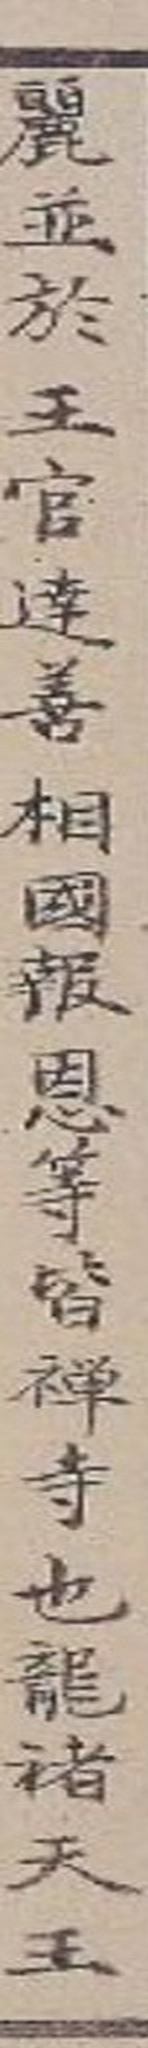麗並於王官達善相国報恩等皆禅寺也竜禇天王
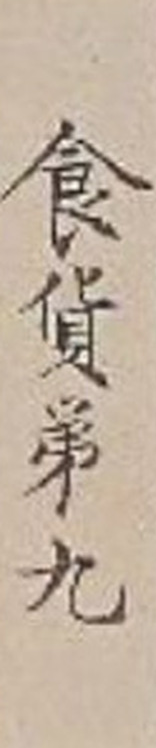食貨第九
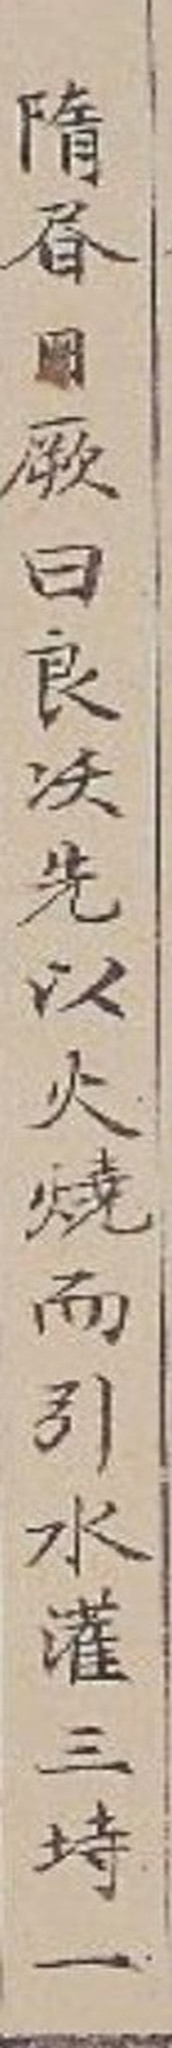隋厥曰良㓇先以火焼而引水灌三一
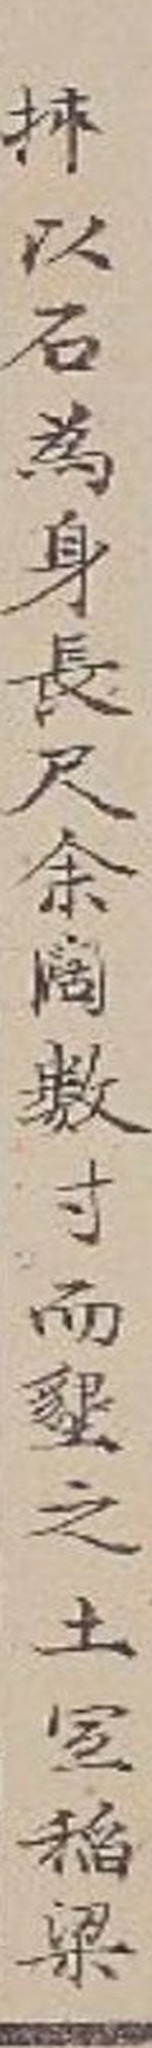挿以石為身長尺余闊数寸而墾之土宜稲梁
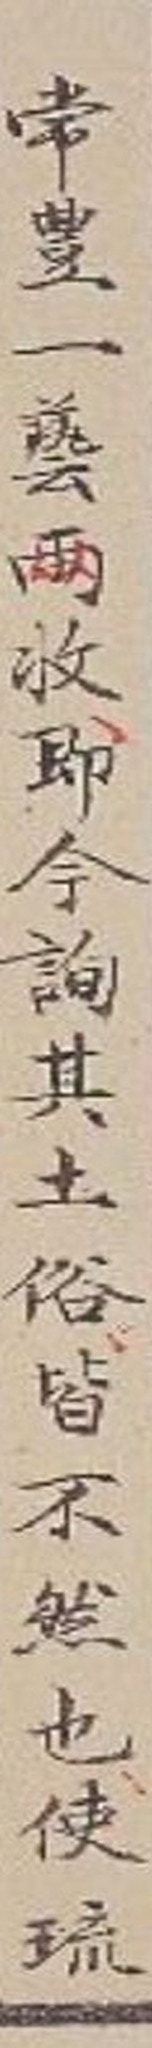常豊一芸両収、即今詢其土俗、皆不然也、使琉
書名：南島志 全
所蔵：University of the Ryukyus Library
